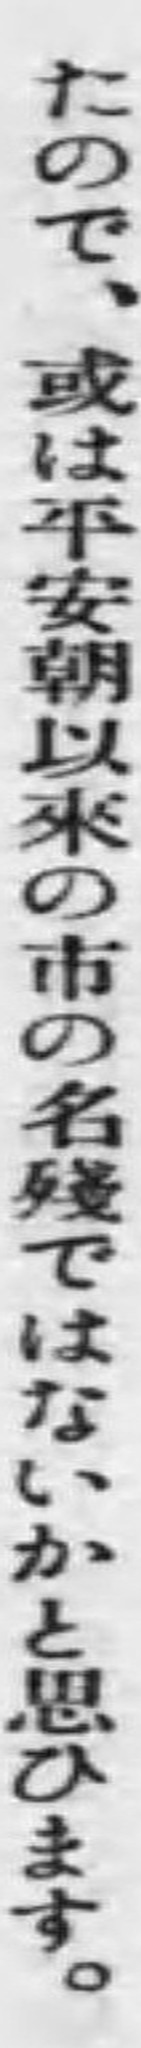たので、或は平安朝以来の市の名残ではないかと思ひます。
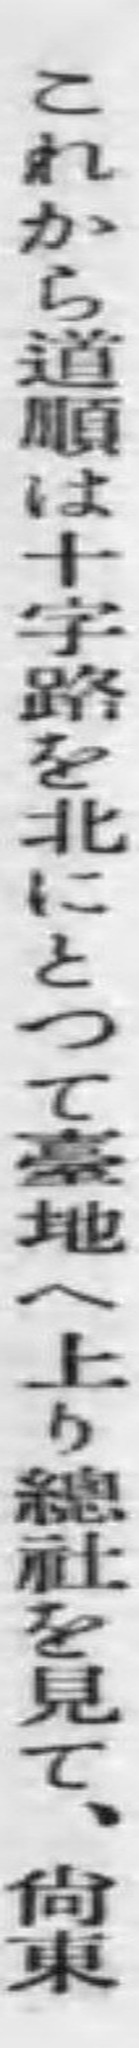これから道順は十字路を北にとつて台地へ上り総社を見て、尚東
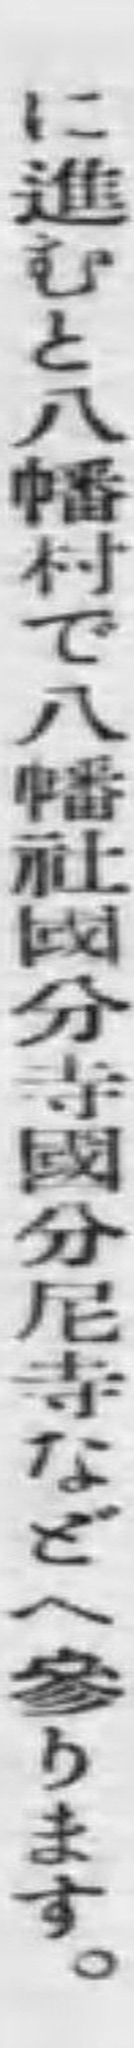に進むと八幡村で八幡社国分寺国分尼寺などへ参ります。
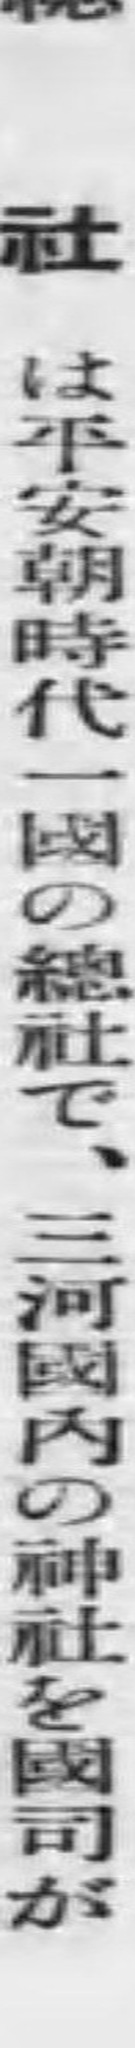総社は平安朝時代一国の総社で、三河国内の神社を国司が
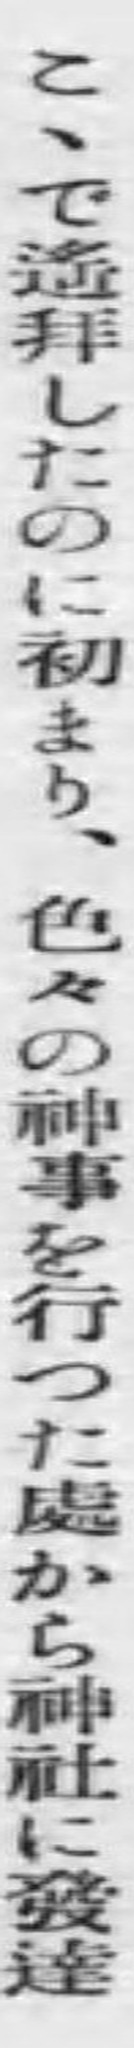こゝで遥拝したのに初まり、色々の神事を行つた処から神社に発達
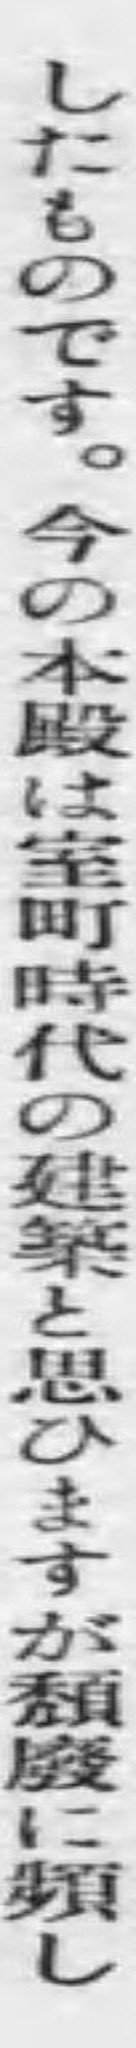したものです。今の本殿は室町時代の建築と思ひますが頽廃に頻し
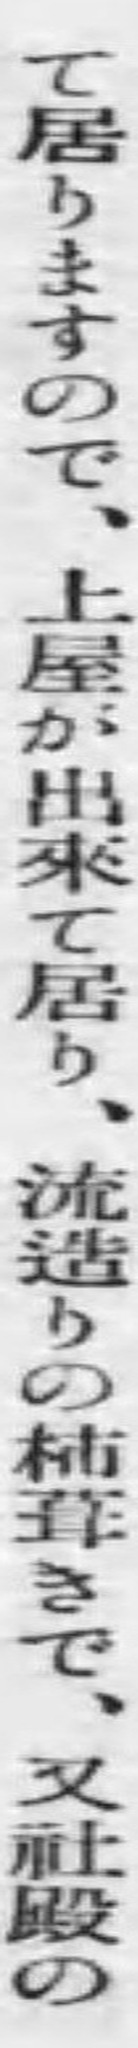て居りますので、上屋が出来て居り、流造りの杮葺きで、又社殿の
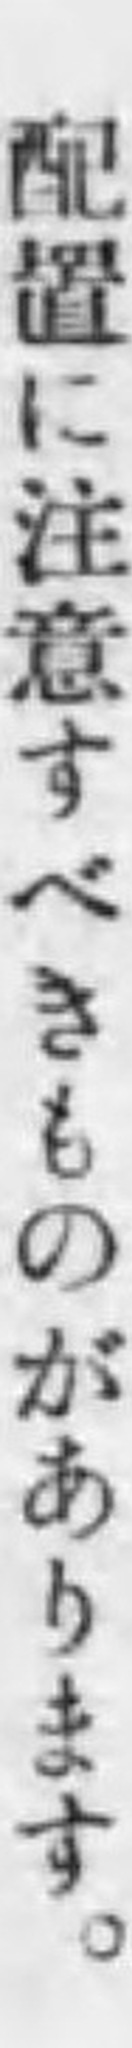配置に注意すべきものがあります。
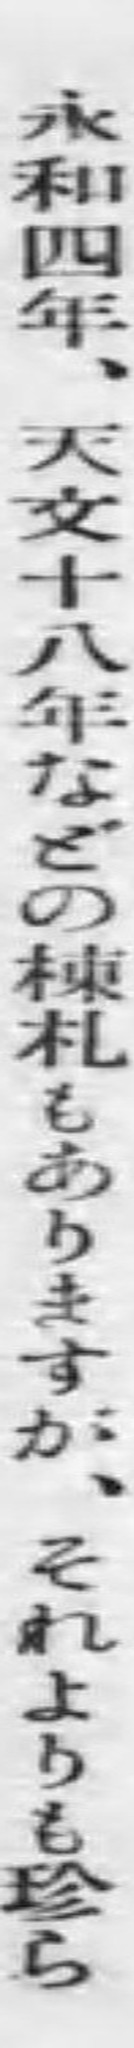永和四年、天文十八年などの棟札もありますが、それよりも珍ら
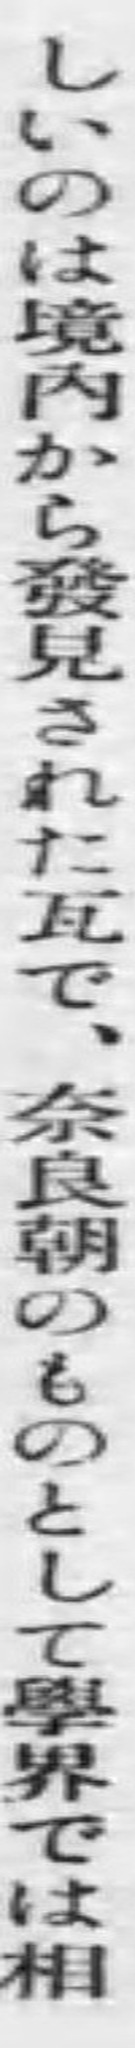しいのは境内から発見された瓦で、奈良朝のものとして学界では相
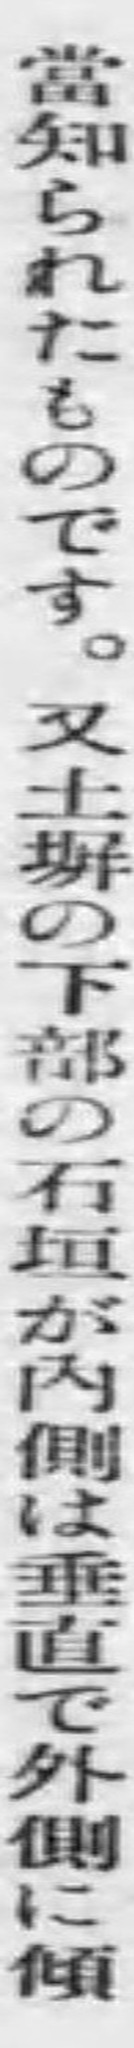当知られたものです。又土塀の下部の石垣が内側は垂直で外側に傾
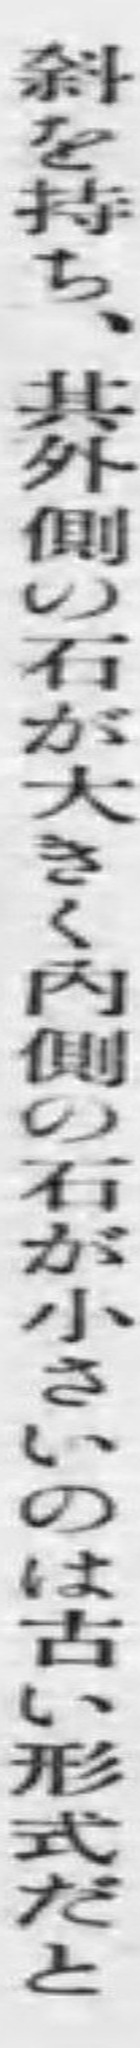斜を持ち、其外側の石が大きく内側の石が小さいのは古い形式だと
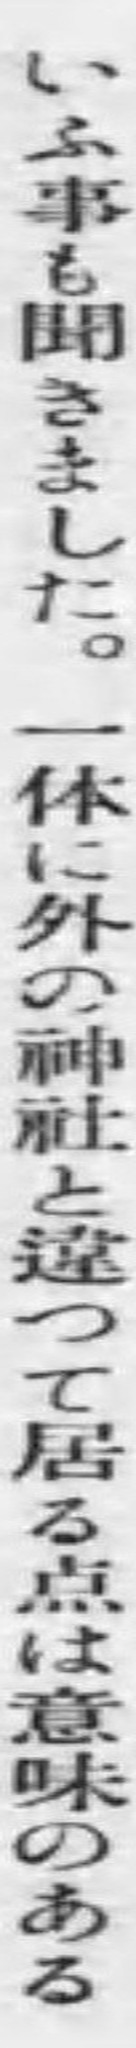いふ事も聞きました。一体に外の神社と違つて居る点は意味のある
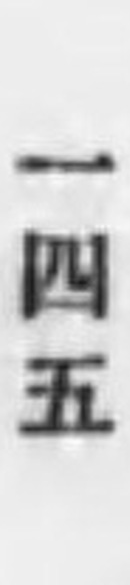一四五

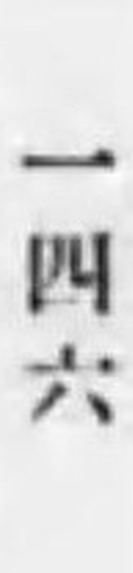一四六
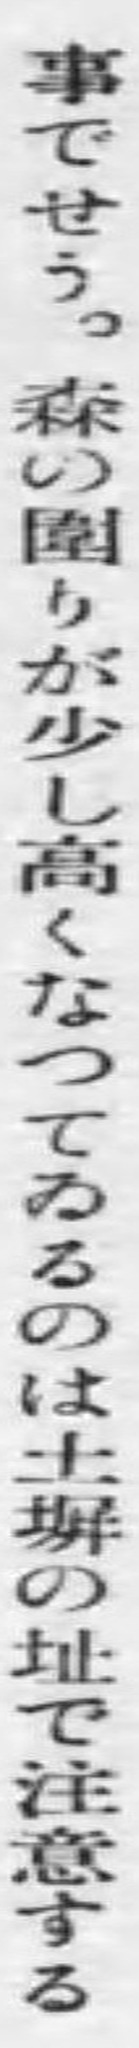事でせう。森の囲りが少し高くなつてゐるのは土塀の址で注意する
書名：東三河道中記 : 豊橋市及其附近案内
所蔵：国立国会図書館 National Diet Library, JAPAN
